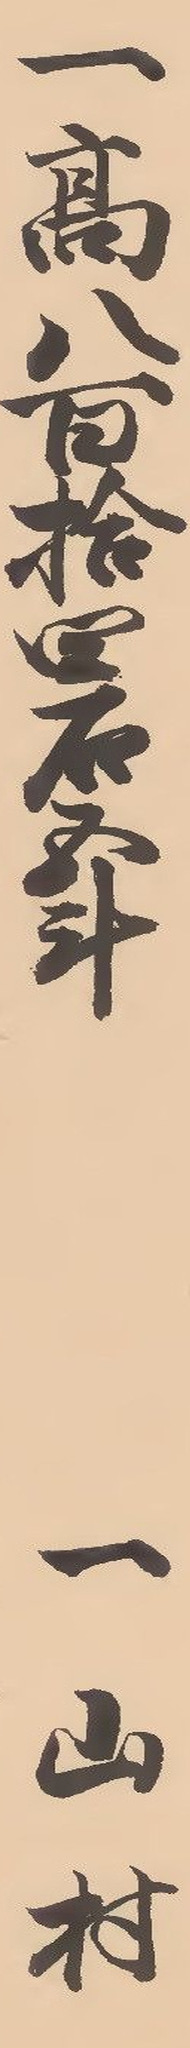一高八百拾四石五斗一山村
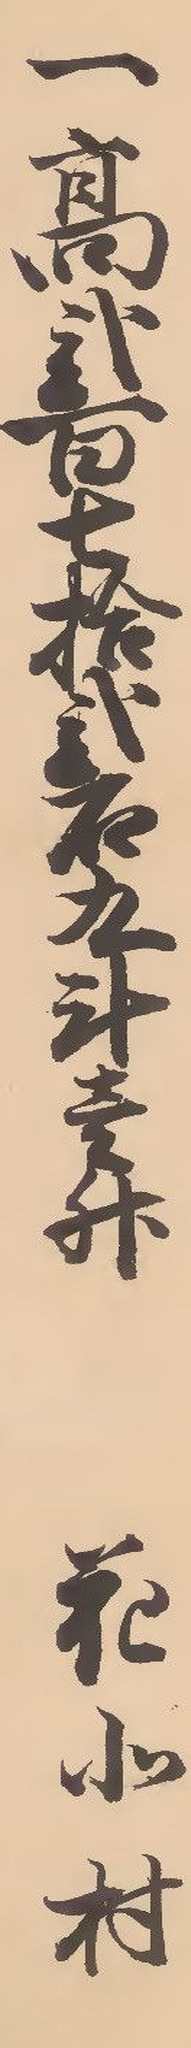一高弐百七拾弐石九斗壱升花北村

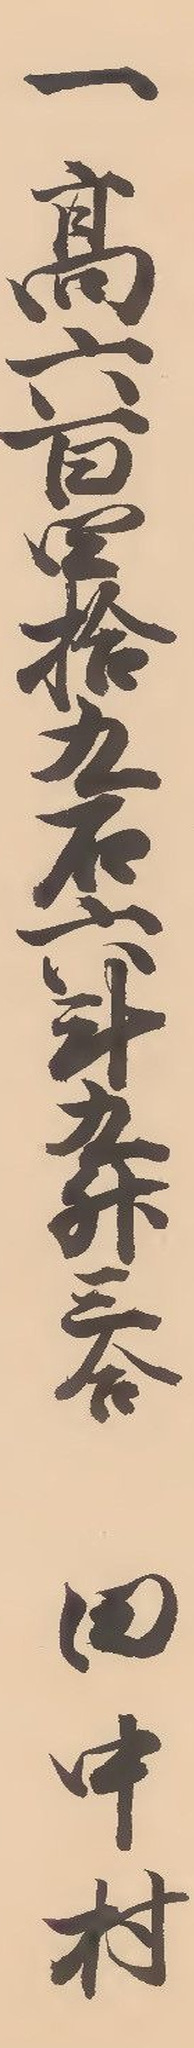一高六百四拾九石六斗九升三合田中村
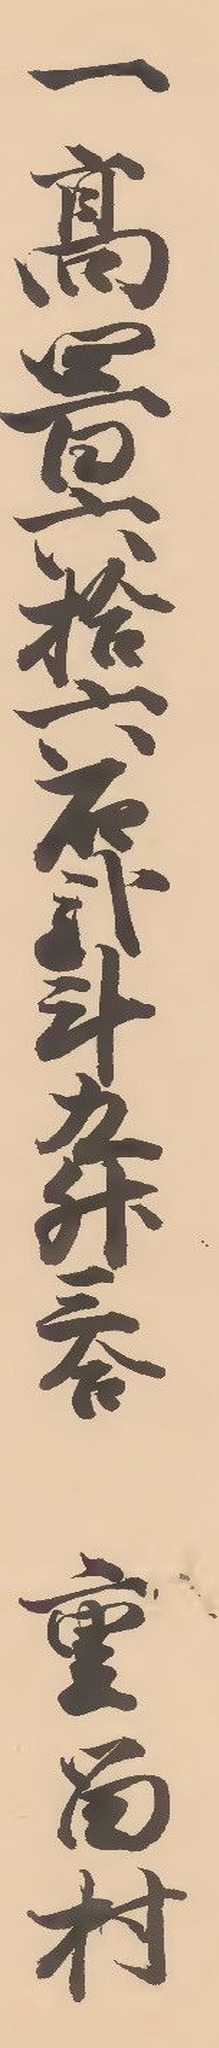一高四百六拾六石弐斗九升三合重留村
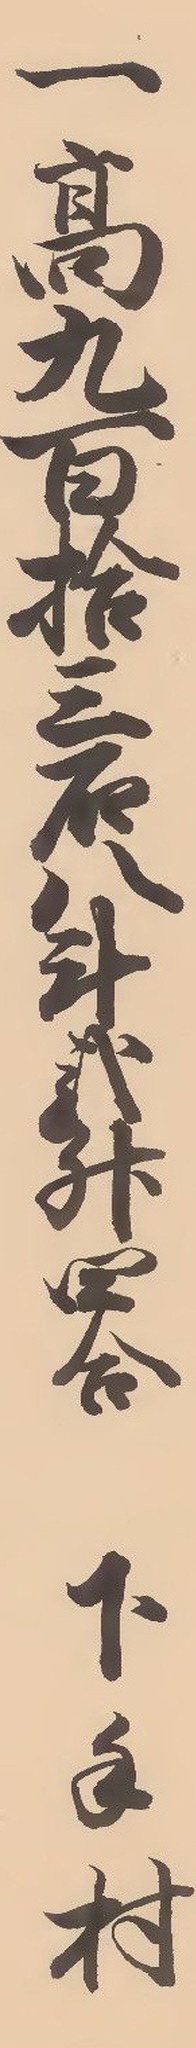一高九百拾三石八斗弐升四合下手村
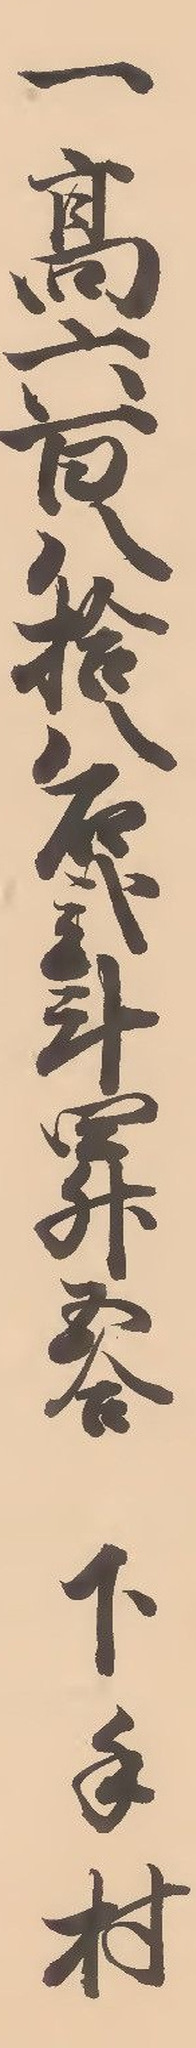一高六百八拾八石弐斗四升五合下手村
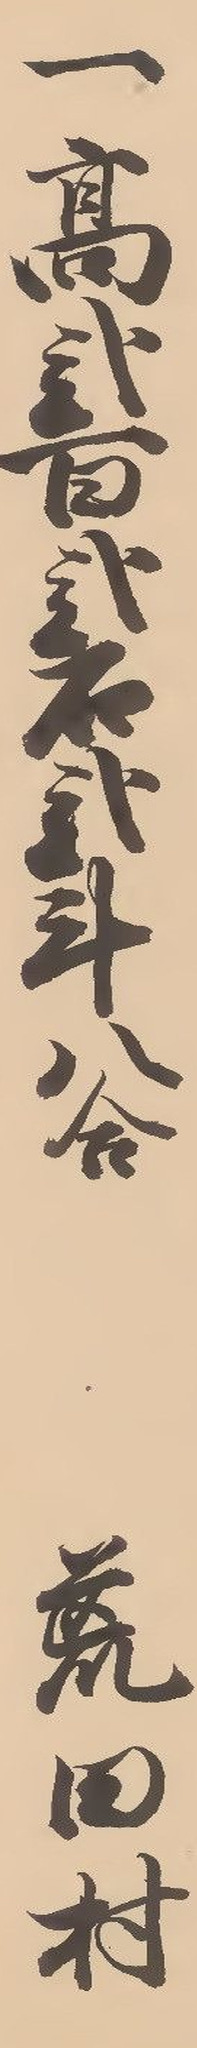一高弐百弐石弐斗八合荒田村
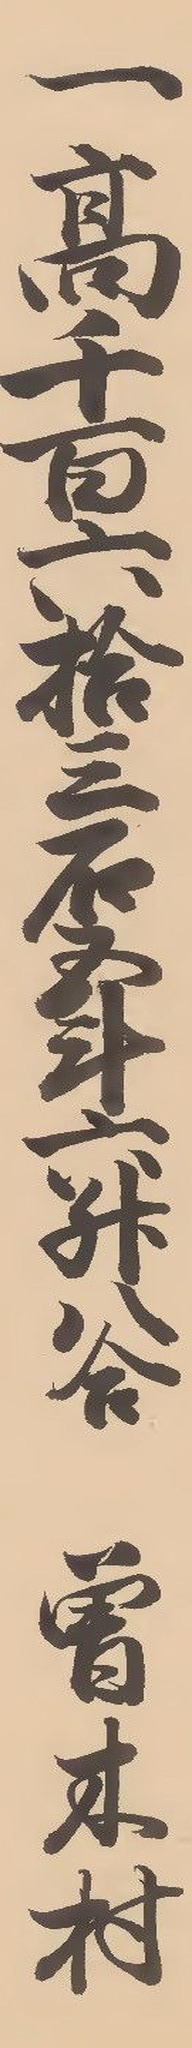一高千百六拾三石五斗六升八合曽木村
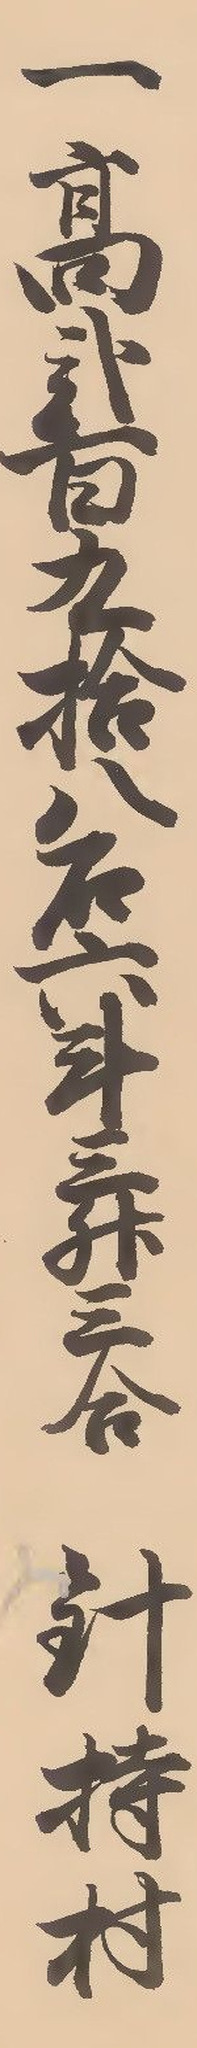一高弐百九拾八石六斗三升三合針持村
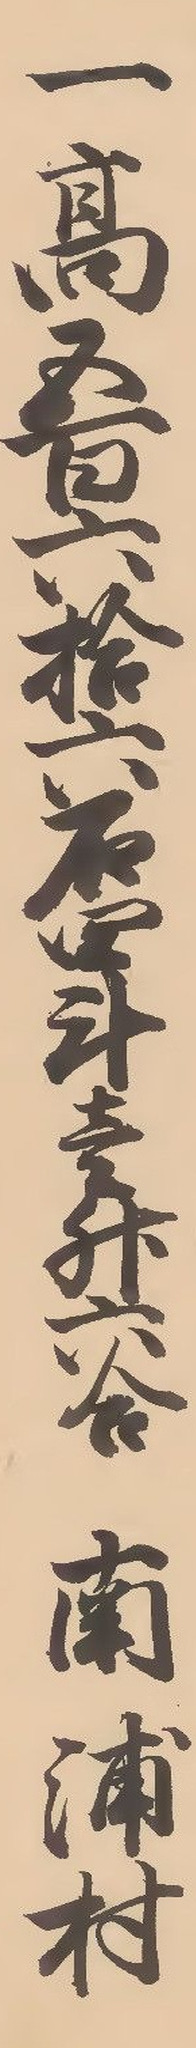一高五百六拾六石四斗壱升六合南浦村

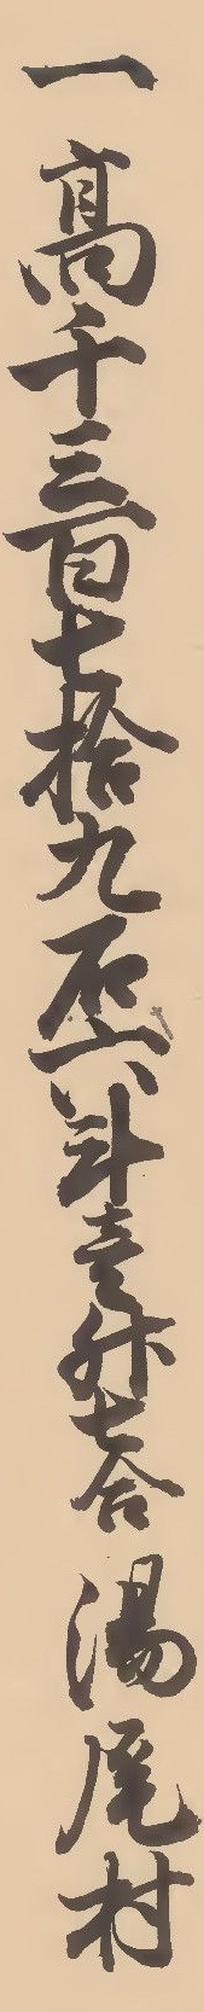一高千三百七拾九石六斗壱升七合湯尾村
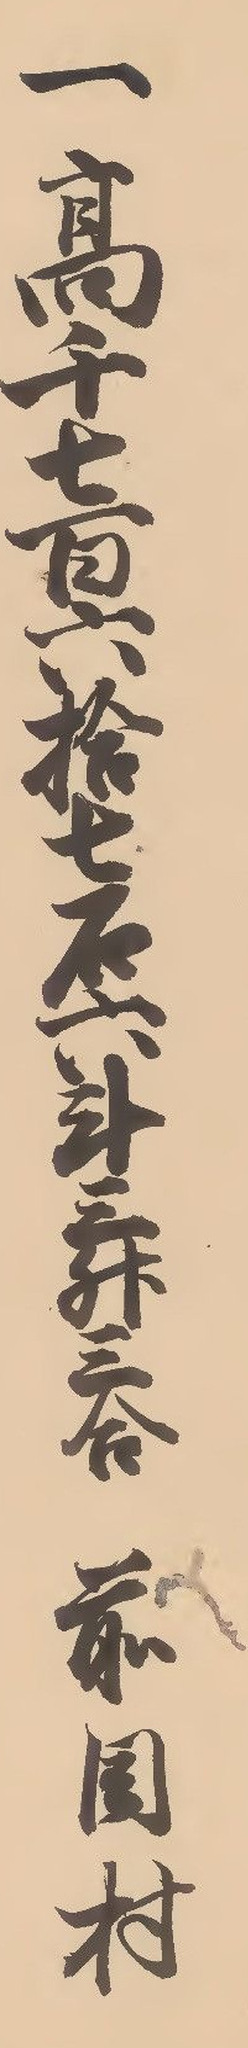一高千七百六拾七石六斗三升三合前園村
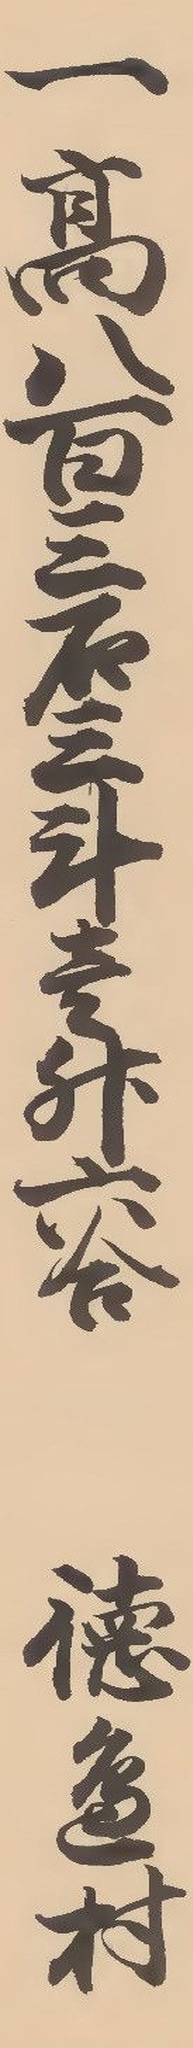一高八百三石三斗壱升六合徳辺村
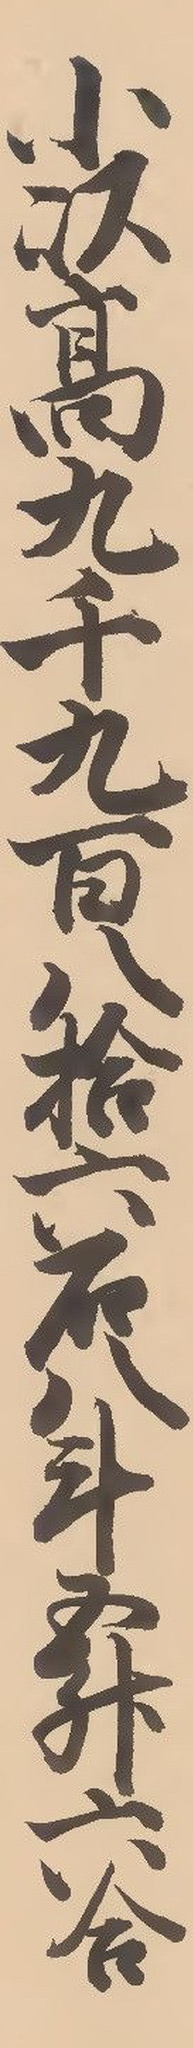小以高九千九百八拾六石八斗五升六合

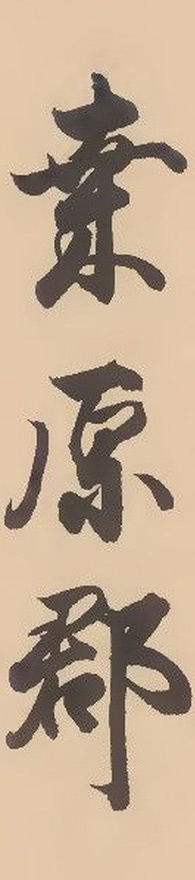桑原郡
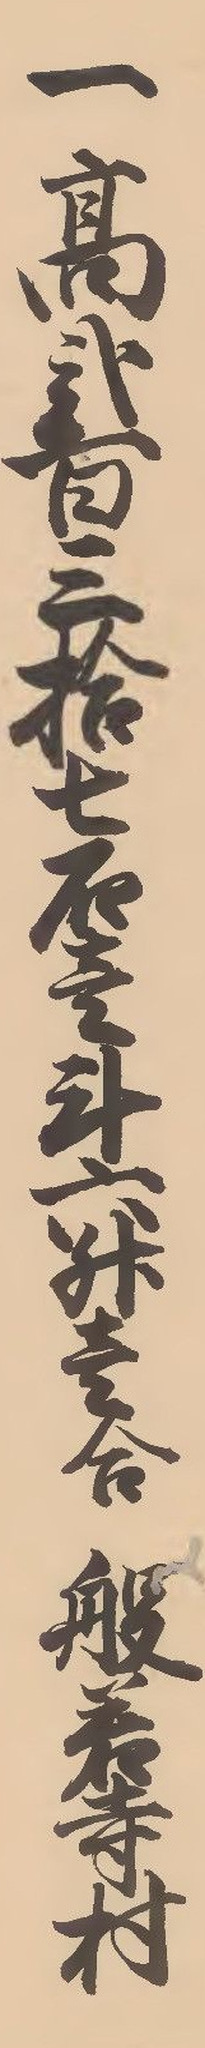一高弐百三拾七石壱斗六升壱合般若寺村
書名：大隅国郷帳
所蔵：国立公文書館 National Archives of Japan
